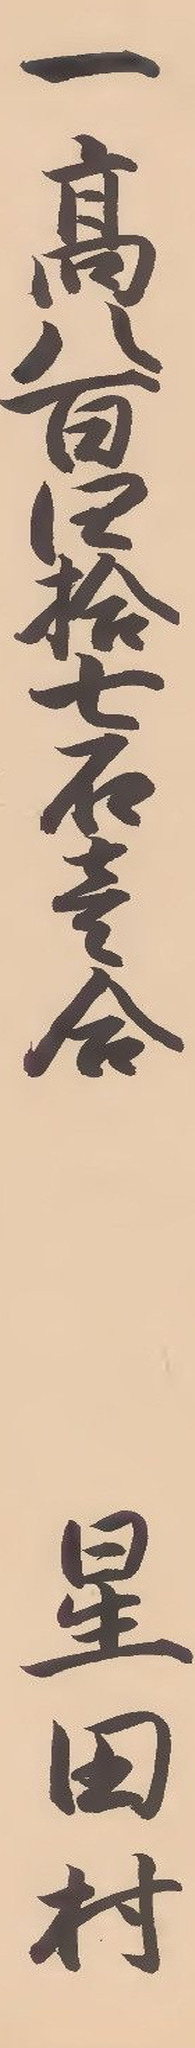一高八百四拾七石壱合星田村
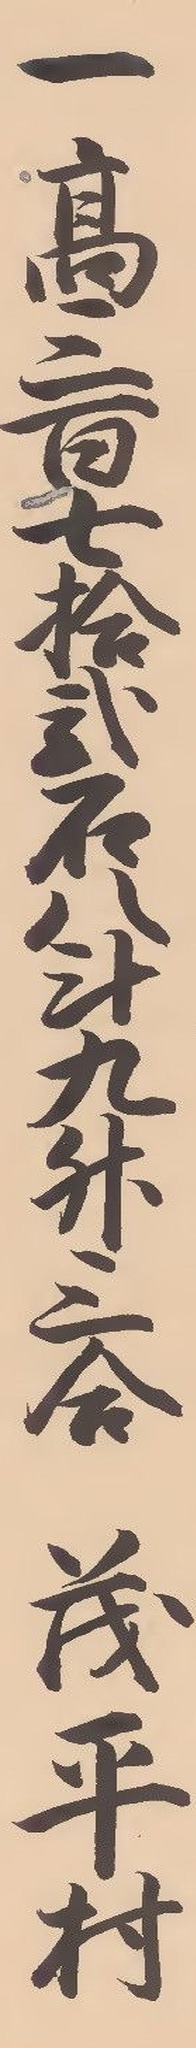一高三百七拾弐石八斗九升三合茂平村

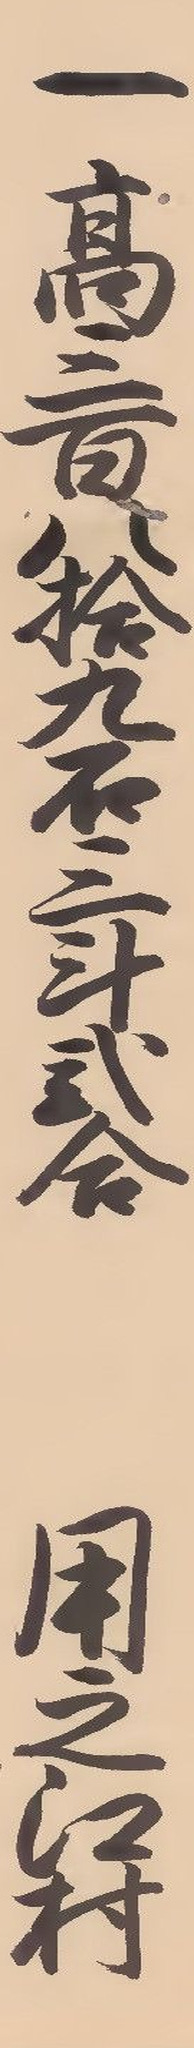一高三百八拾九石三斗弐合用之江村
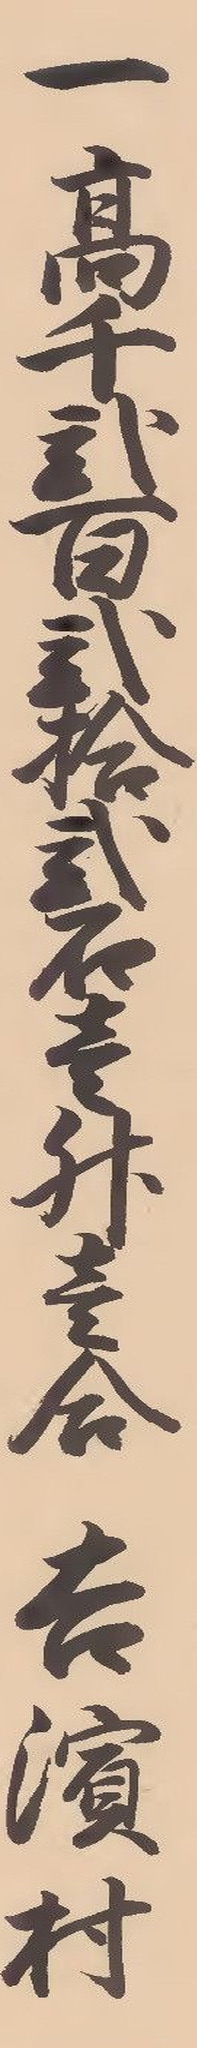一高千弐百弐拾弐石壱升壱合吉浜村
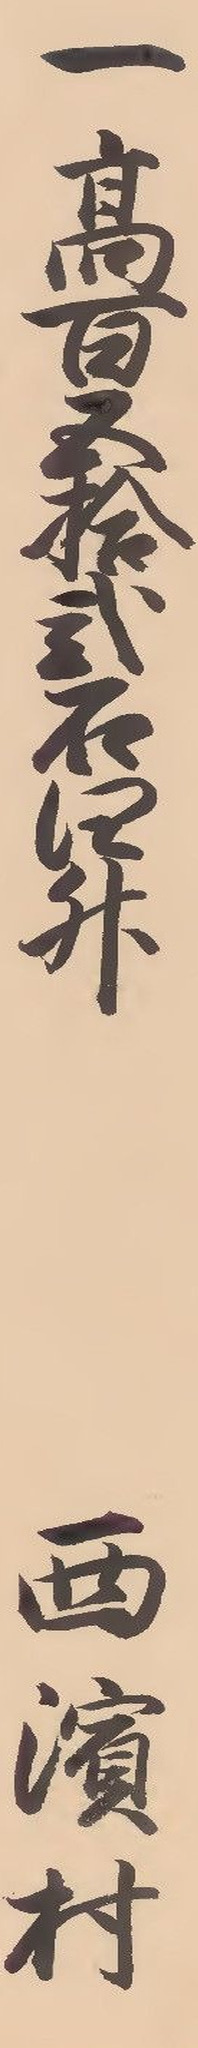一高百五拾弐石四升西浜村
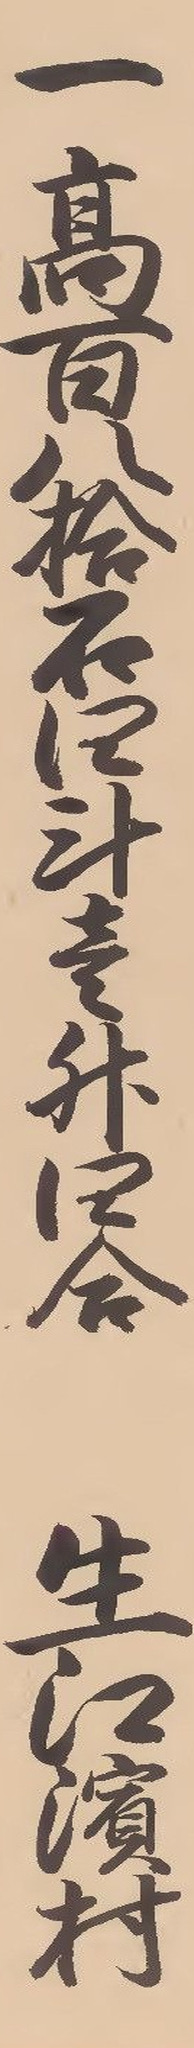一高百八拾石四斗壱升四合生江浜村
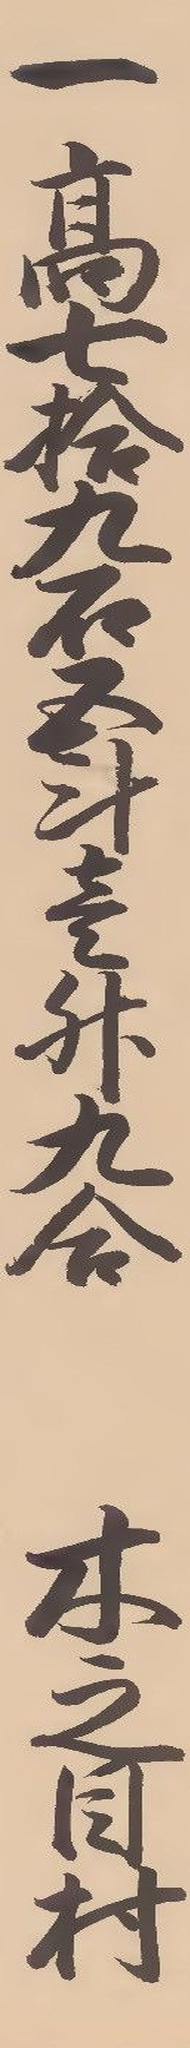一高七拾九石五斗壱升九合木之目村
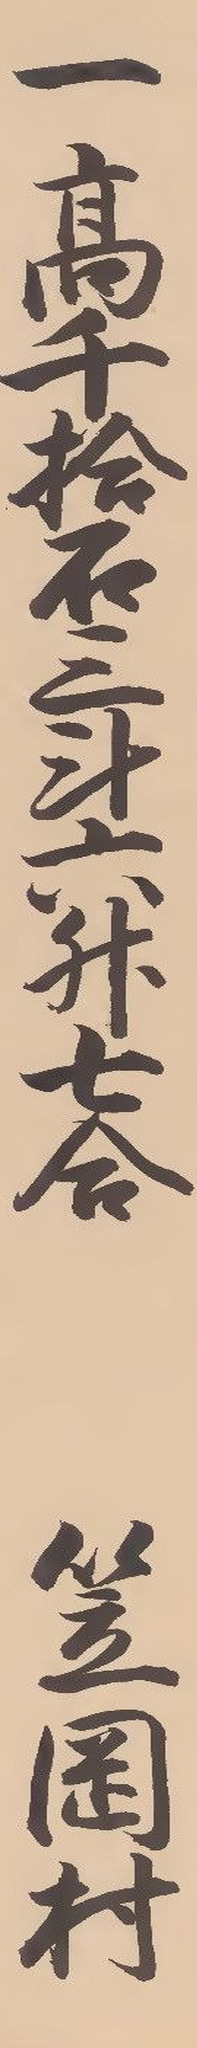一高千拾石三斗六升七合笠岡村
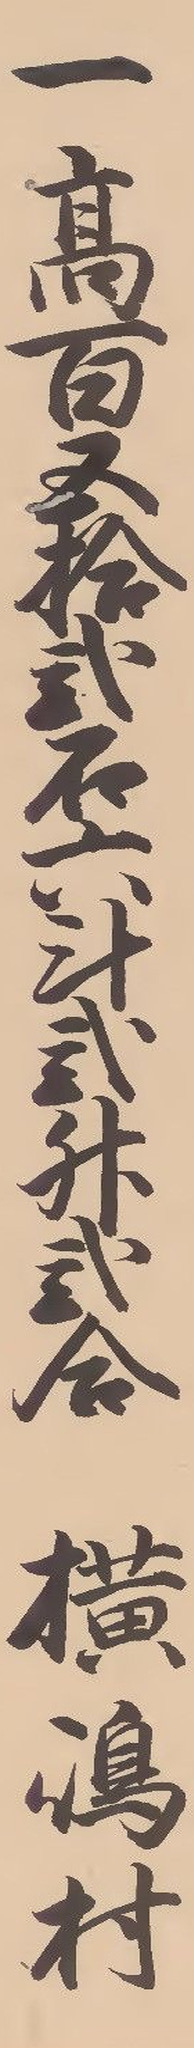一高百五拾弐石六斗弐升弐合横島村

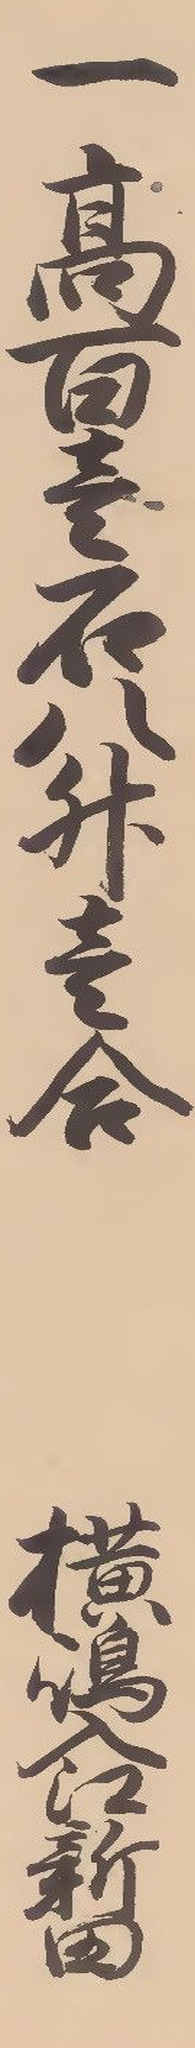一高百壱石八升壱合横島入江新田
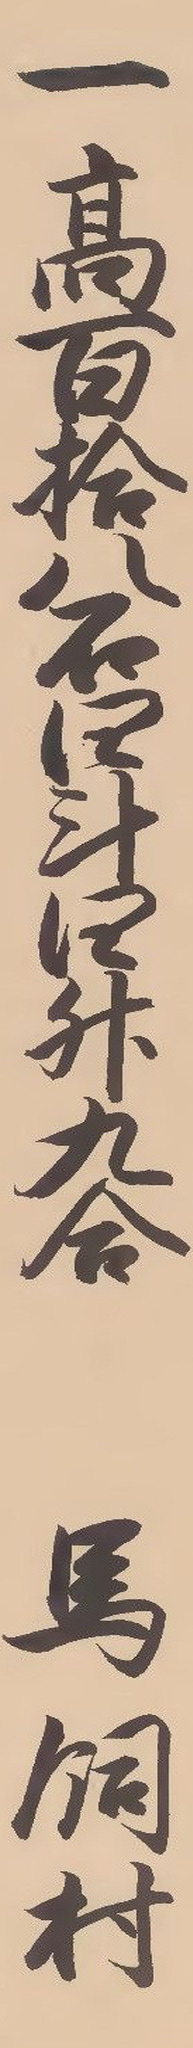一高百拾八石四斗四升九合馬飼村
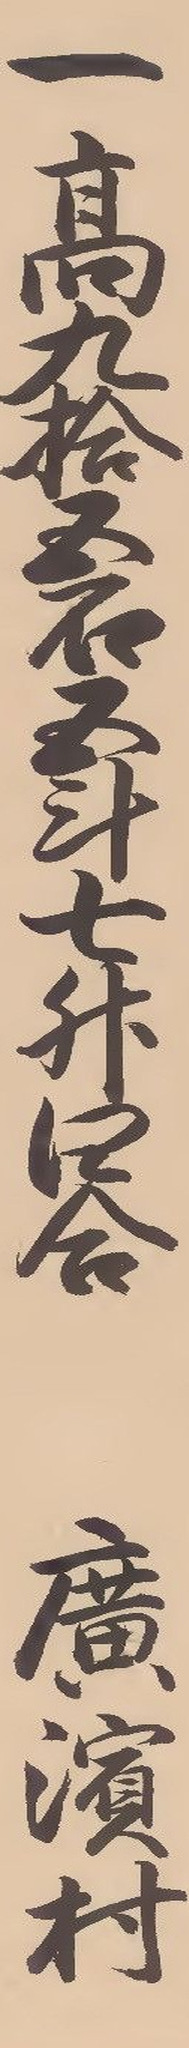一高九拾五石五斗七升四合広浜村
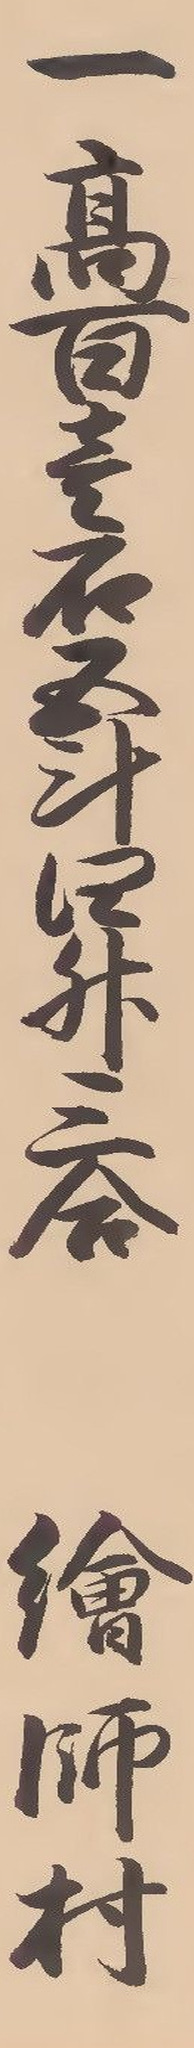一高百壱石五斗四升三合絵師村
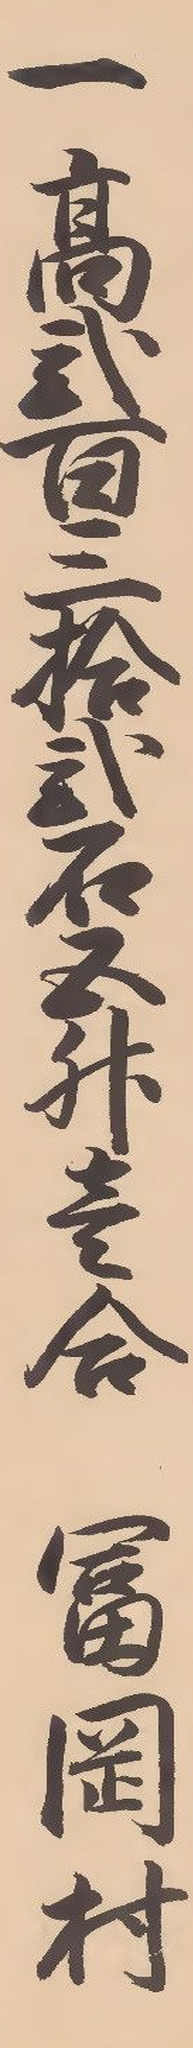一高弐百三拾弐石五升壱合富岡村
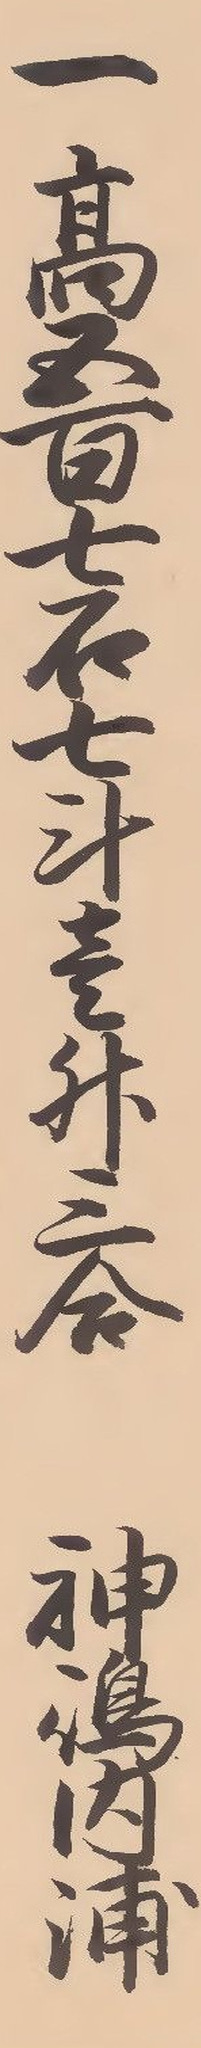一高五百七石七斗壱升三合神島内浦
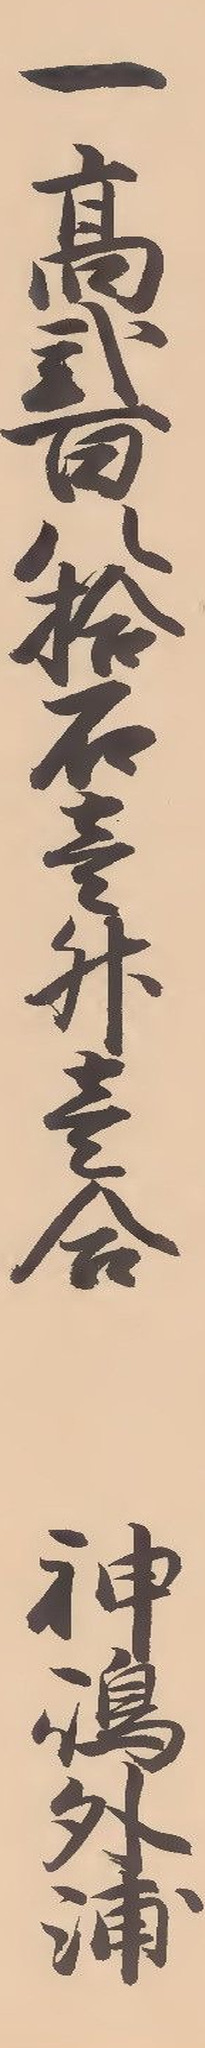一高弐百八拾石壱升壱合神島外浦
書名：備中国郷帳
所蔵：国立公文書館 National Archives of Japan
